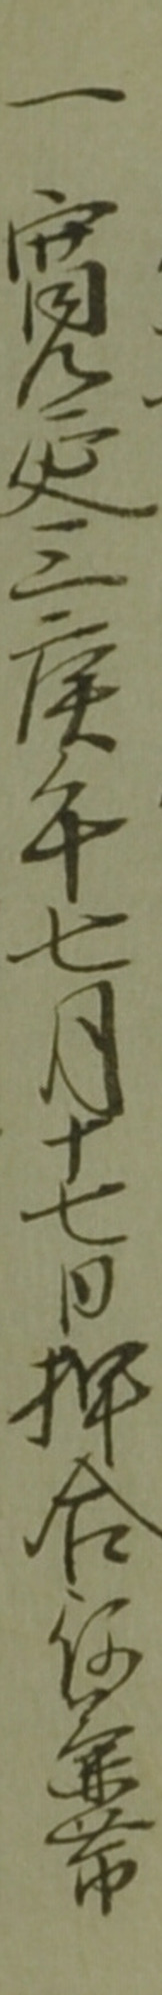一寛延三庚午七月十七日押合役兼帯
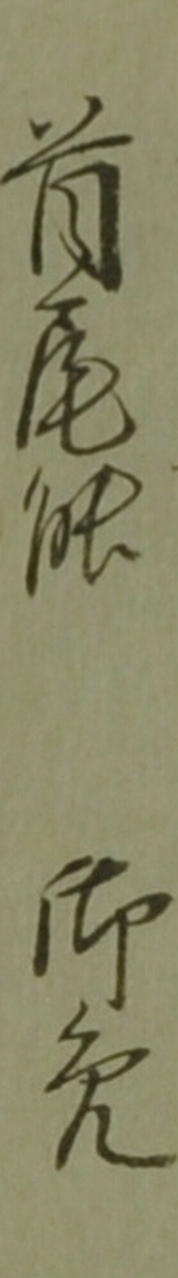首尾能御免
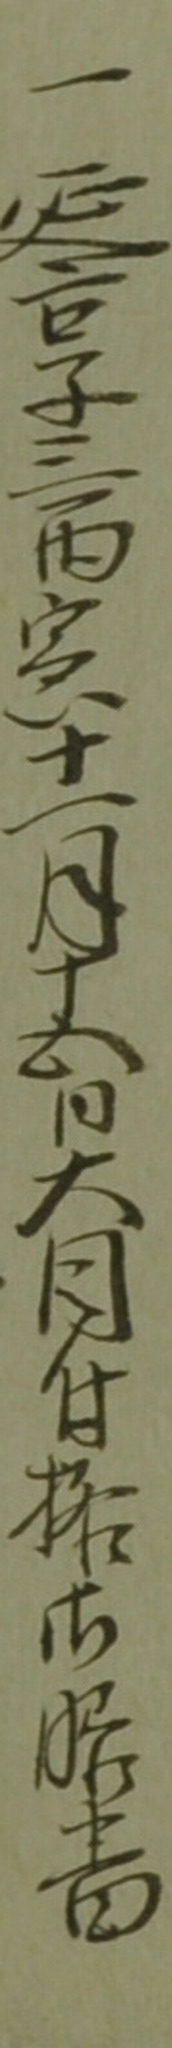一延享三丙寅十一月十五日大目付格御膳番
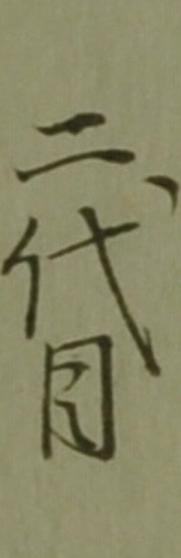二代目
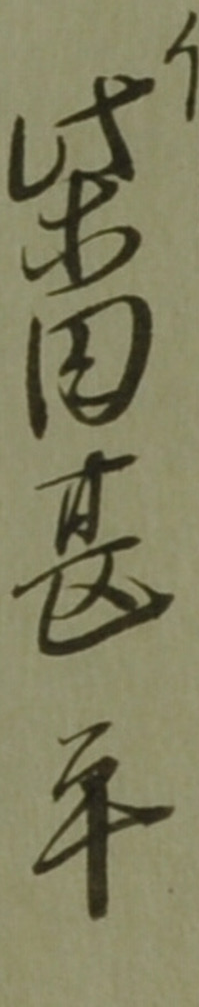柴田甚平
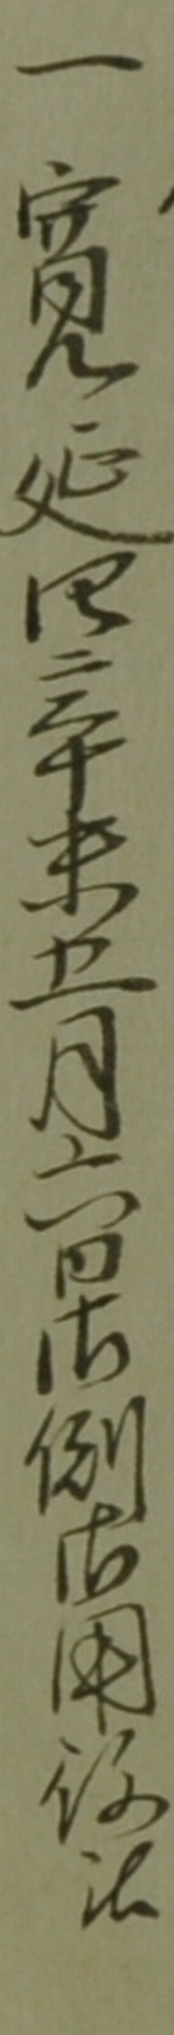一寛延四辛未五月六日御側御用役被
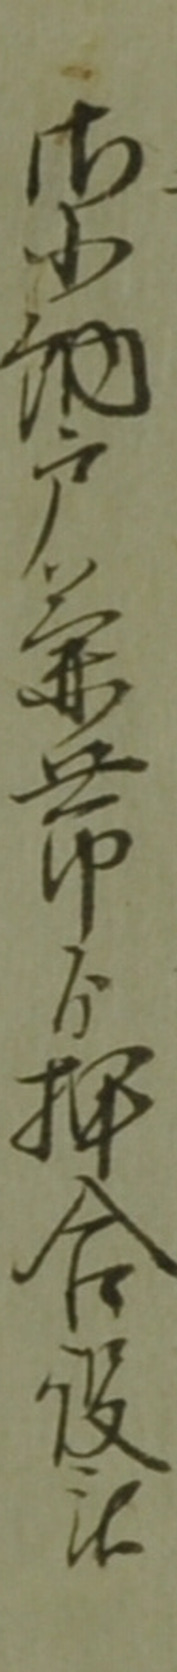御小納戸兼帯ゟ押合役被
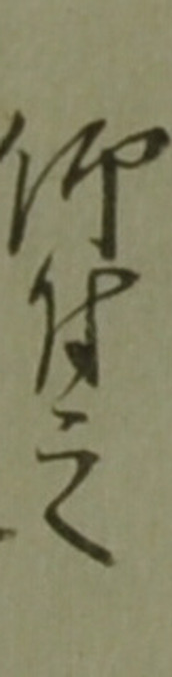仰付之
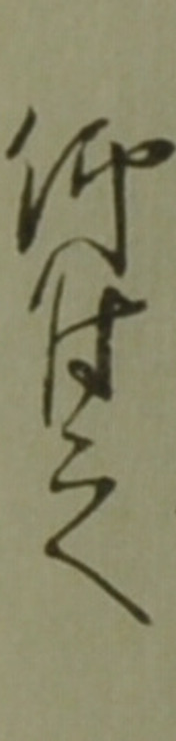仰付之

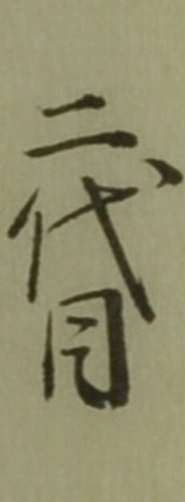二代目
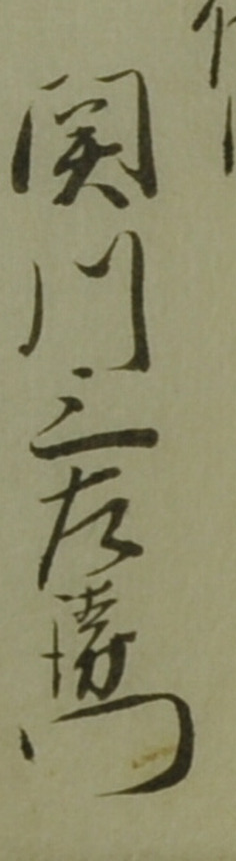関川三左衛門
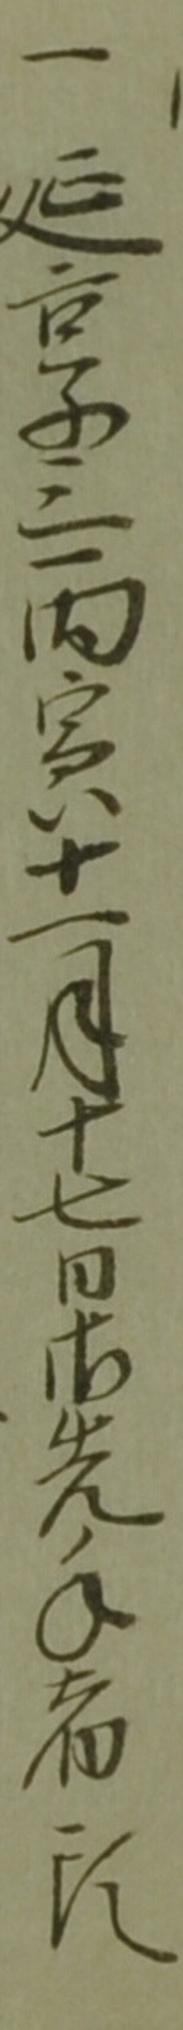一延享三丙寅十一月十七日御先手者頭
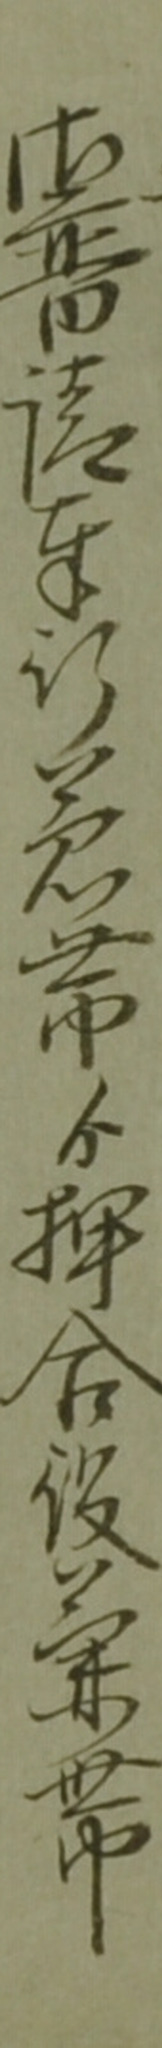御普請奉行兼帯ゟ押合役兼帯
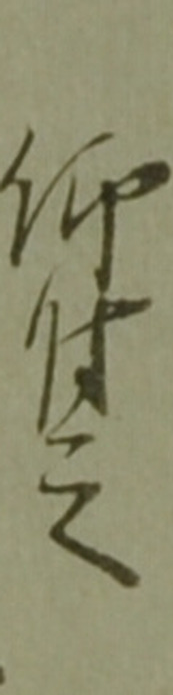仰付之
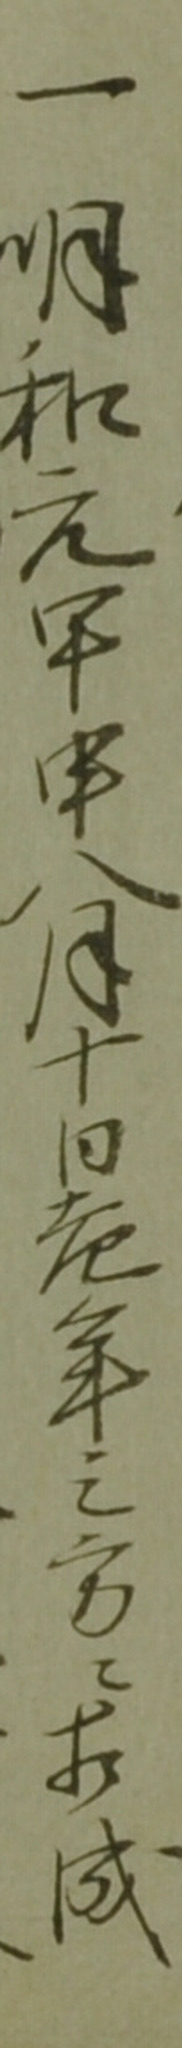一明和元甲申八月十日老年之方相成
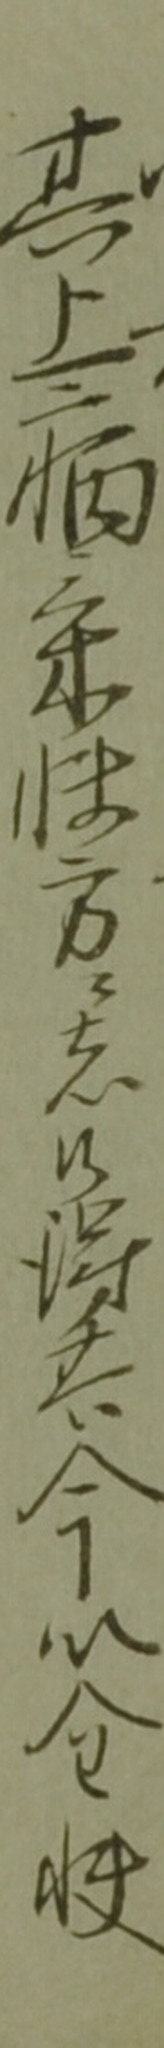其上病気快方者候得共今以全快
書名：諸御役代々録（七）
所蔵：伊那市立高遠町図書館・合同会社AMANE
